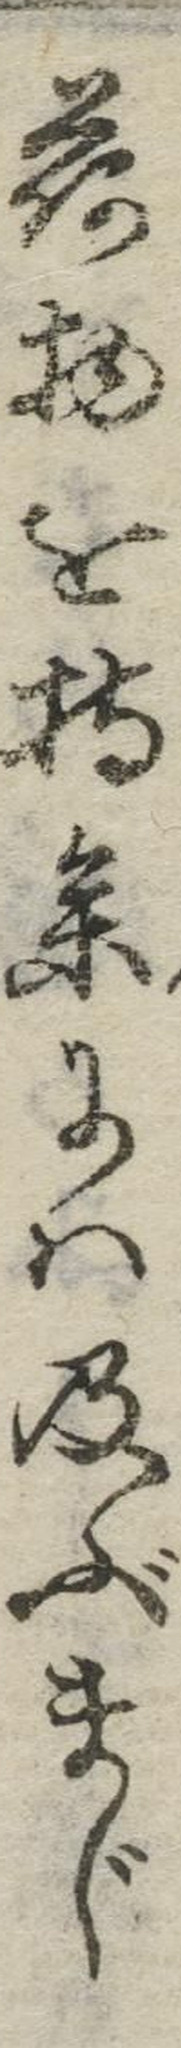荷物を持参には及ぶまじ
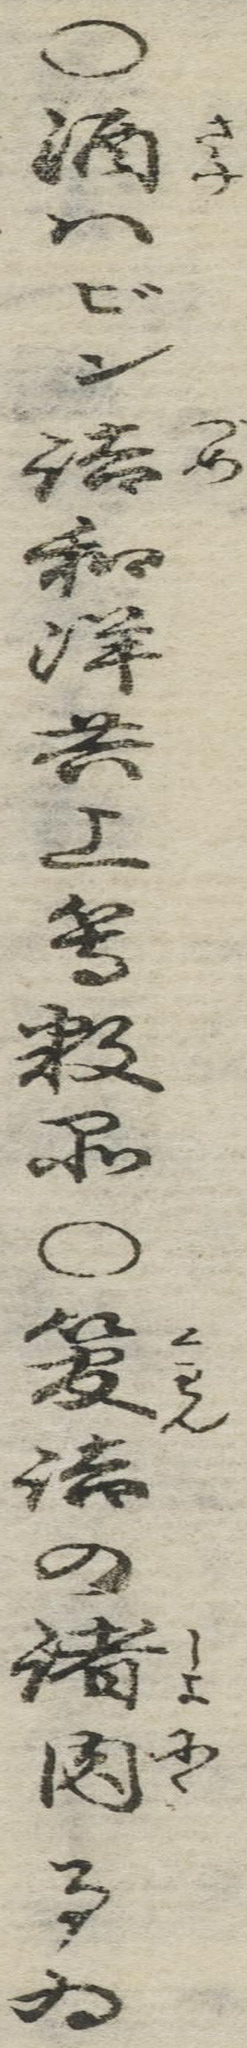○酒はビン詰和洋共上等数品○管詰の諸肉るゐ
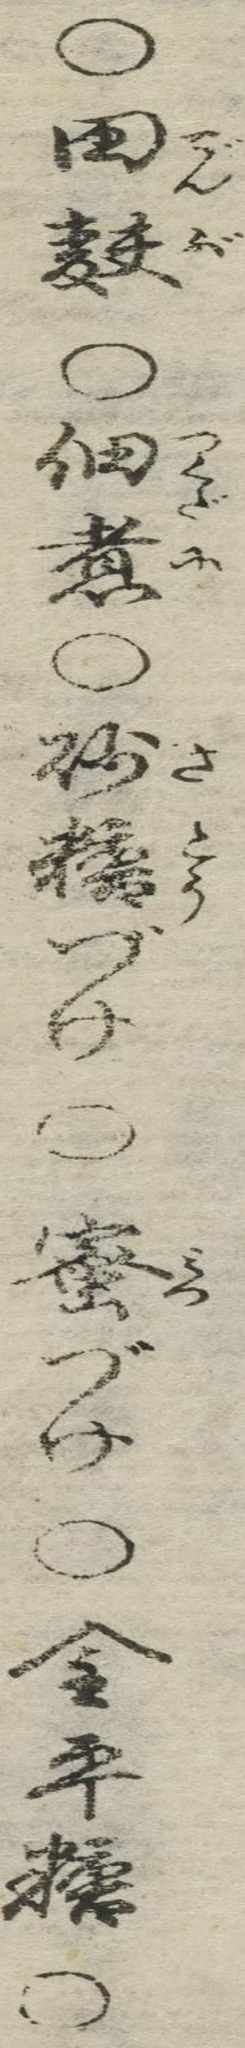○田麩○佃煮○砂糖づけ○蜜づけ○金平糖○
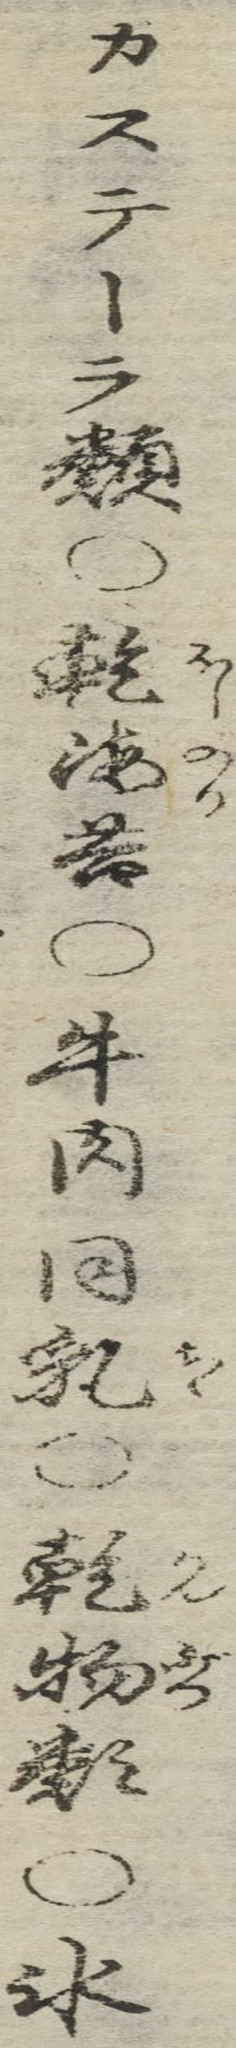カステーラ類○乾海苔○牛肉同乳○乾物類○氷
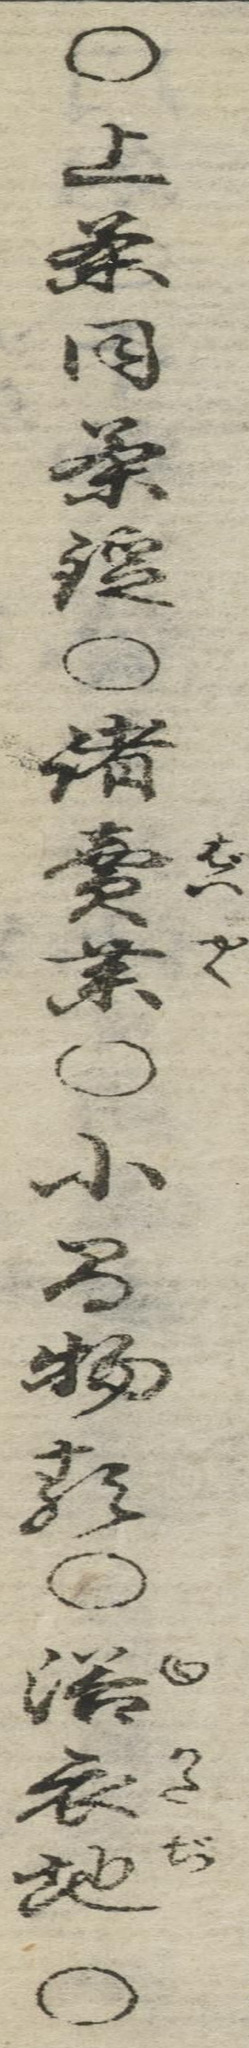○上茶同茶○諸賣薬○小間物類○浴衣地○

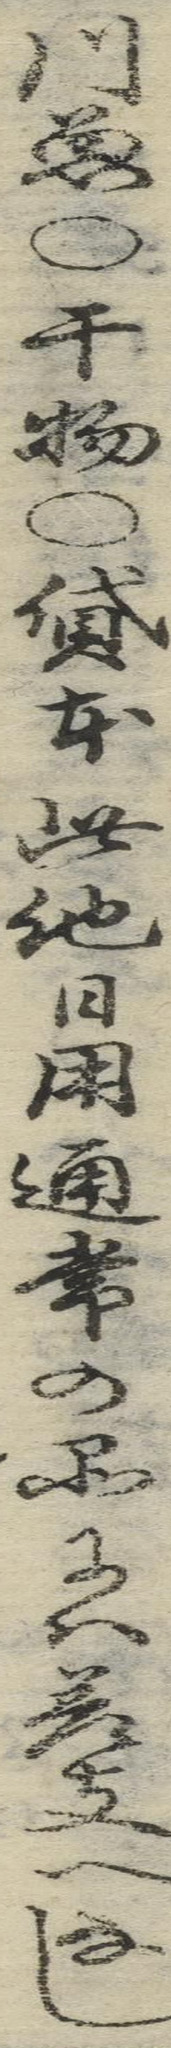川魚○干物○貸本此他日用通常の品には差支へなし
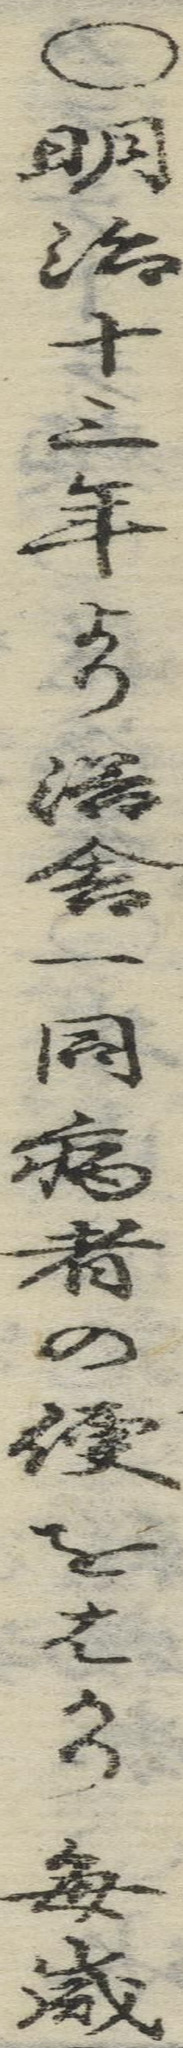○明治十三年より浴舎一同病者の便をはかり毎歳
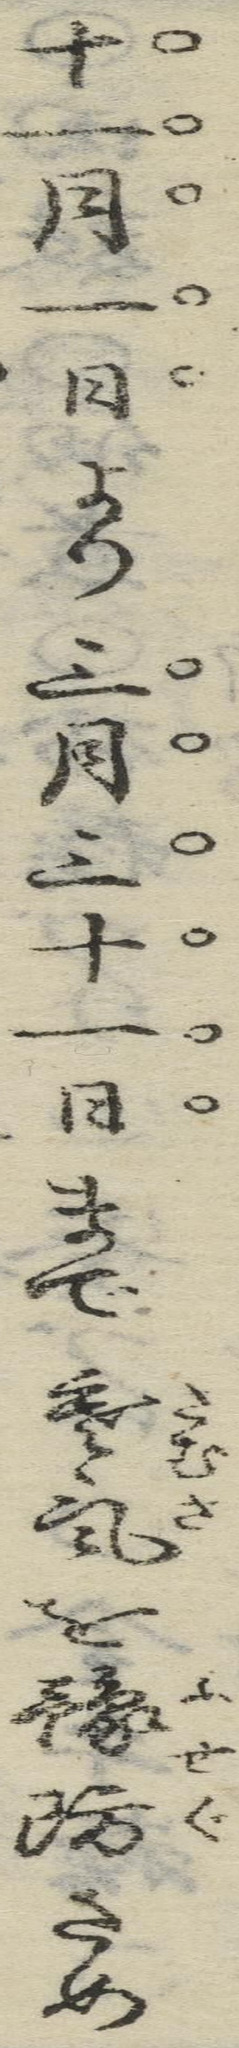十一月一日より三月三十一日まで寒気を豫防ため
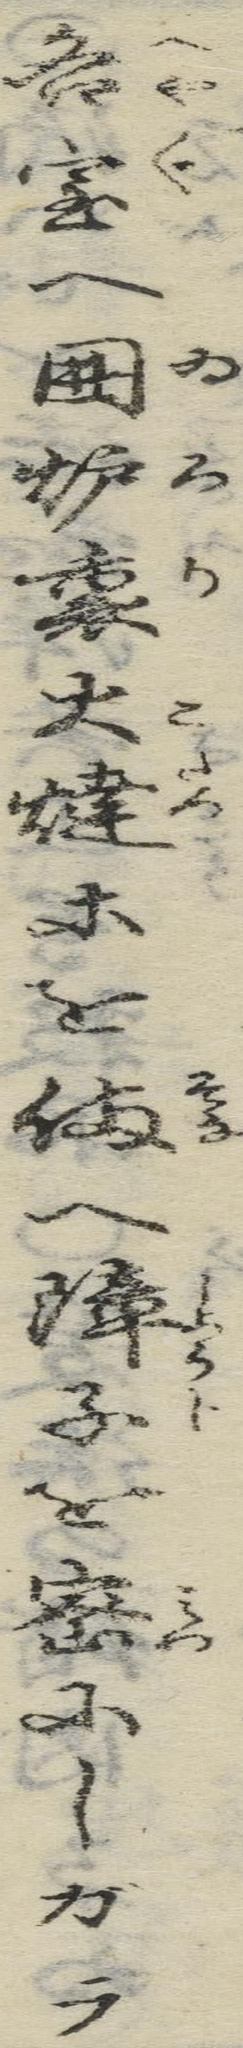各室へ囲炉裏火燵等を備へ障子を密にしガラ
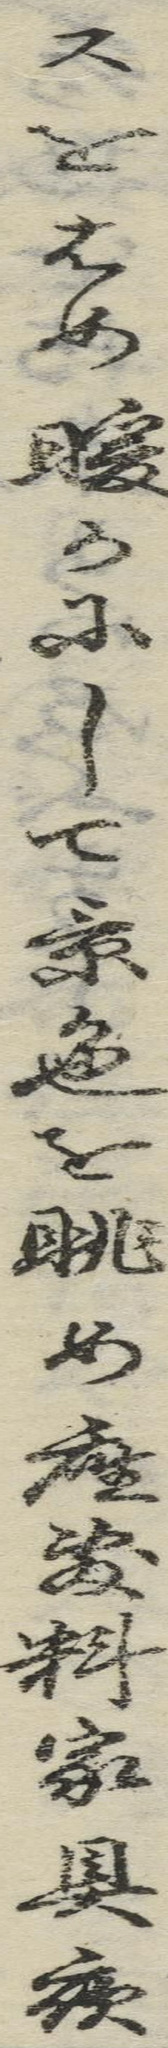スをはめ暖かにして景色を眺め座敷料家具夜
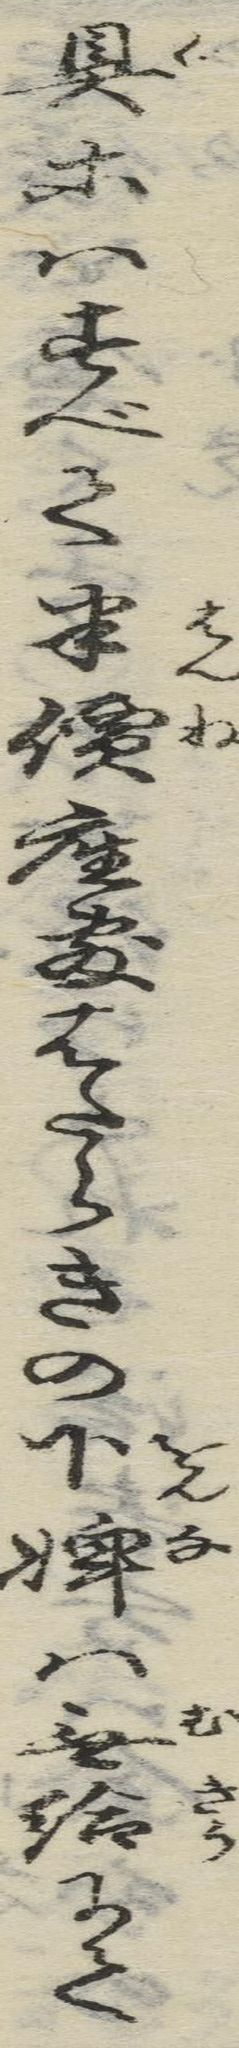具等はすべて半價座敷はたらきの下婢？は無給にて
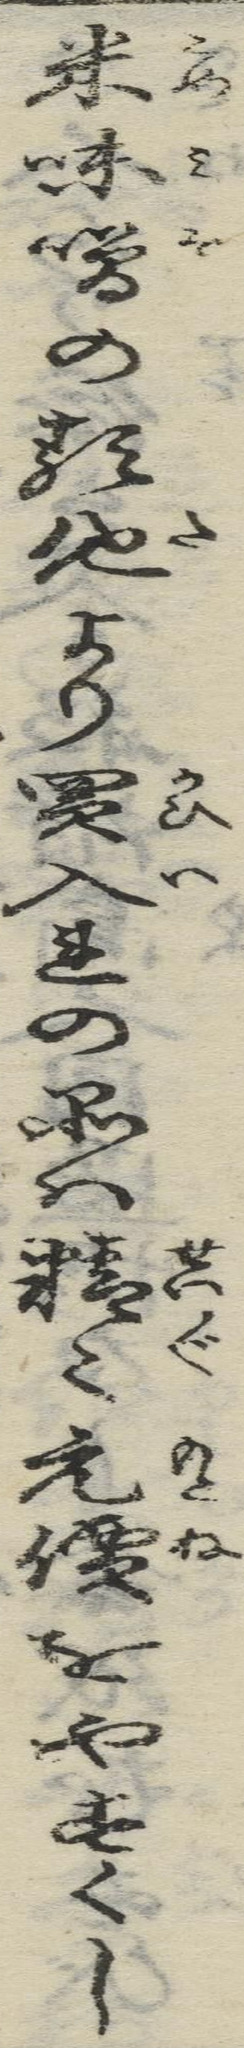米味噌の類他より買入れの品は精々元價をやすくし
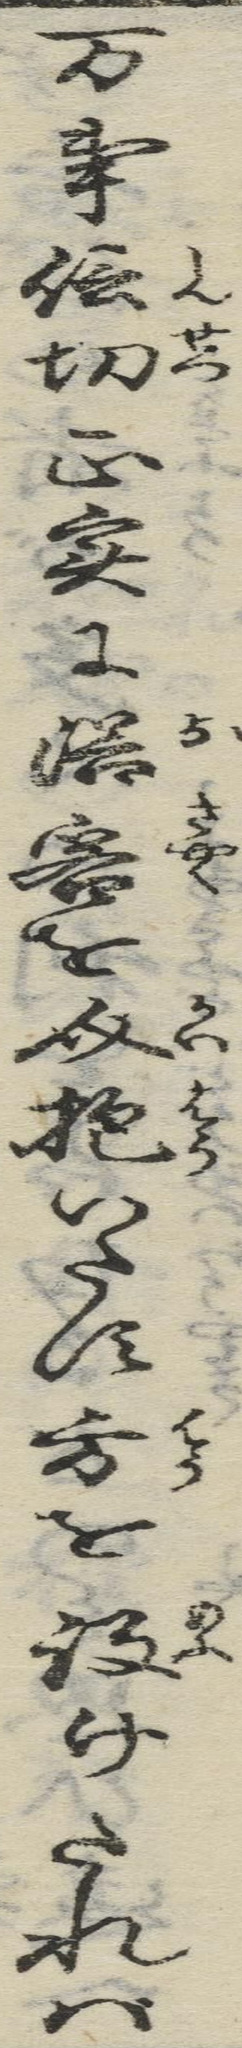万事信切正実に浴客を介抱いたす方を設けたれば
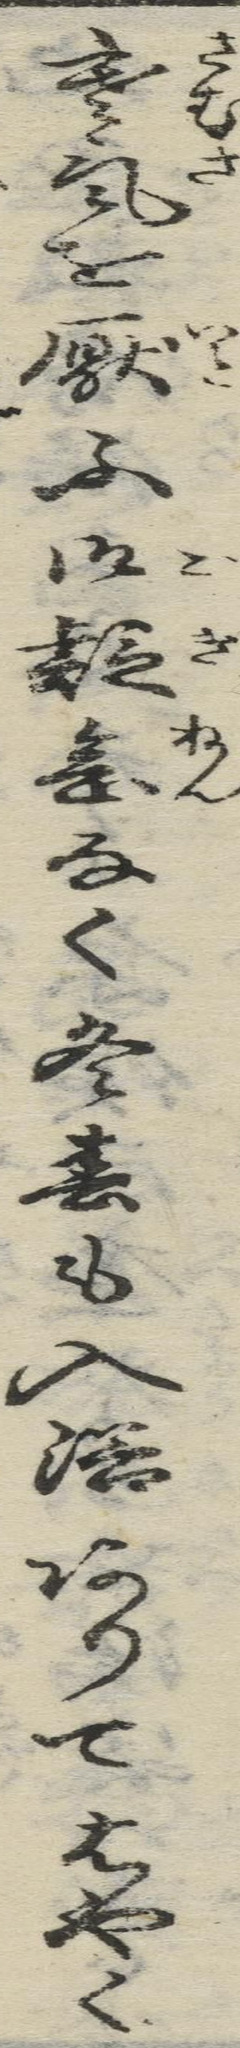寒気を厭ふ御疑念なく冬春も入浴ありてはやく
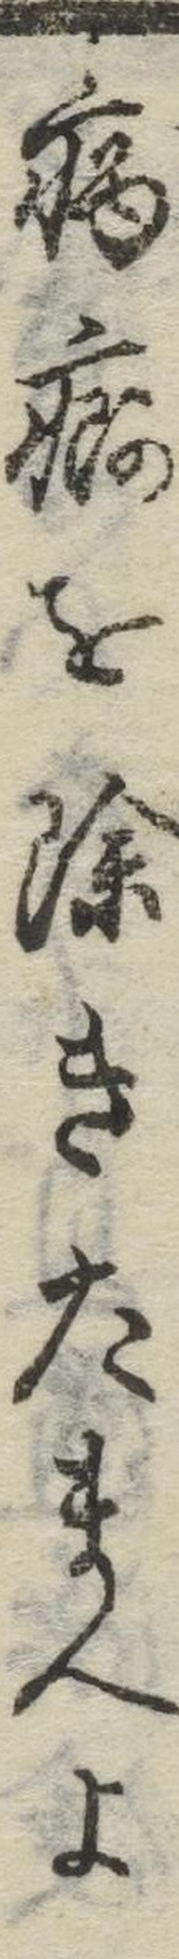病痾を除きたまへよ
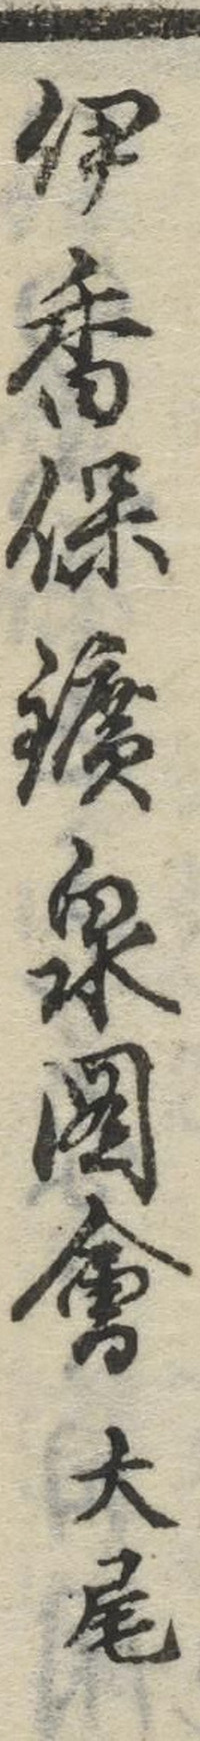伊香保鑛泉圖會大尾
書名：上州伊香保鑛泉圖會　全
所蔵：東京大学地震研究所図書室 Earthquake Research Institute Library, The University of Tokyo, JAPAN
